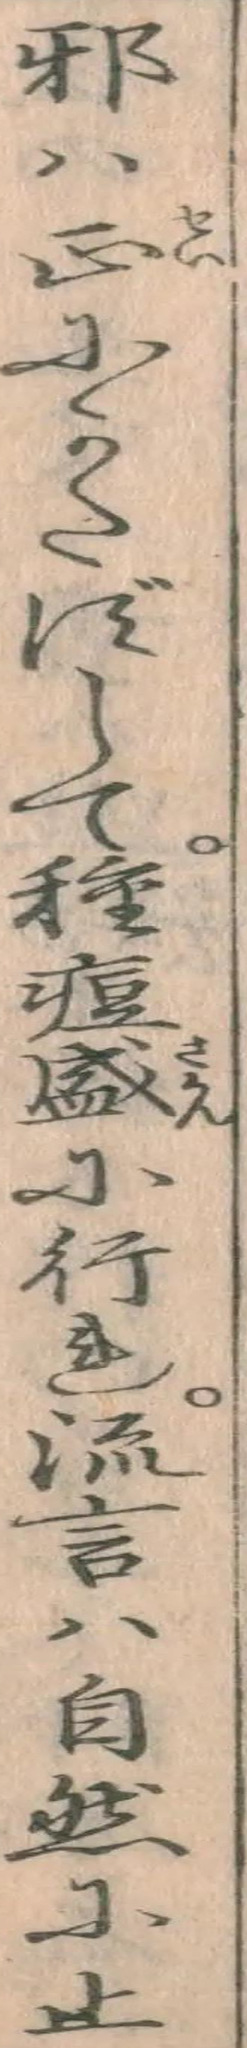邪は正にかたずして。種痘盛に行れ。流言は自然に止
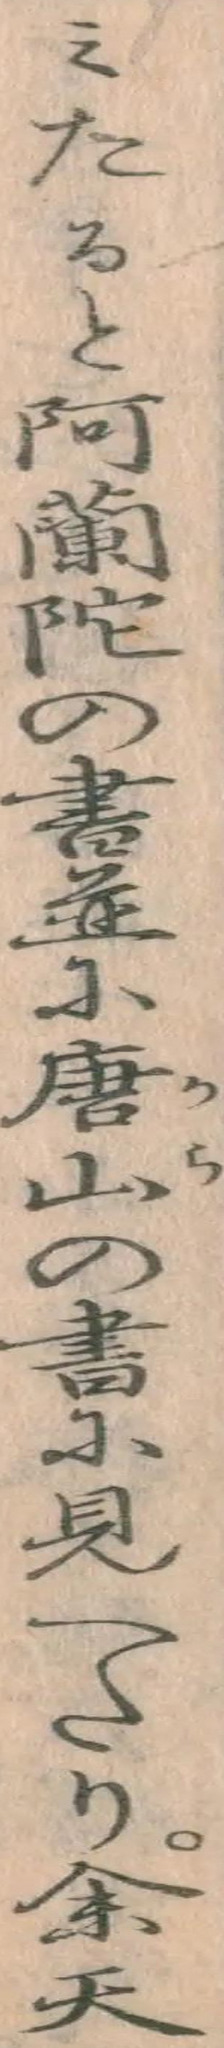みたると阿蘭陀の書並に唐山の書に見へたり。余天
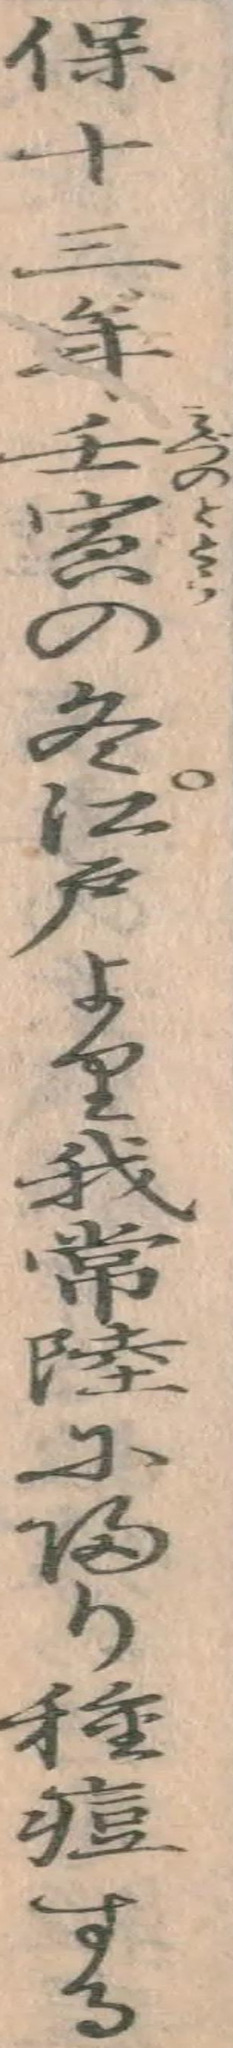保十三年壬寅の冬。江戸より我常陸に帰り種痘する
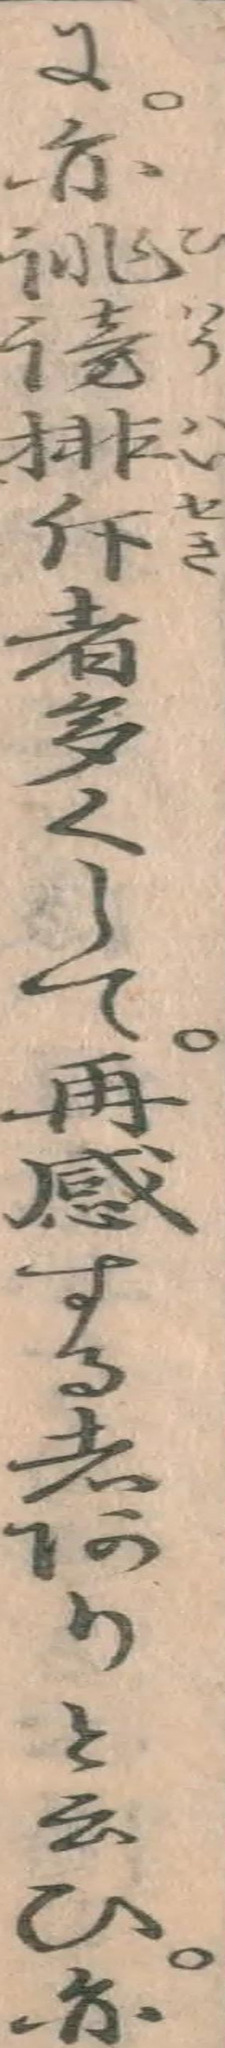に。亦誹謗排斥者多くして。再感する者ありと云ひ。亦
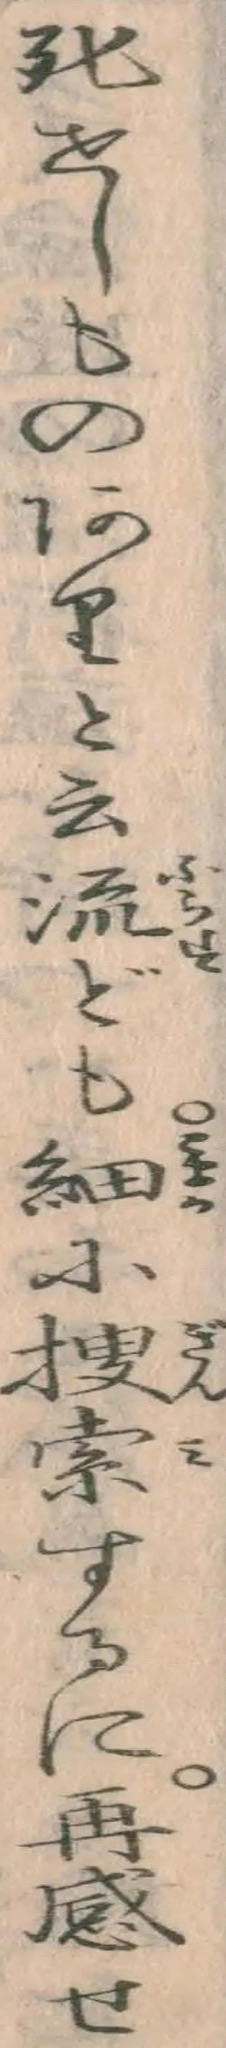死せしものありと云流ども。細に捜索するに。再感せ
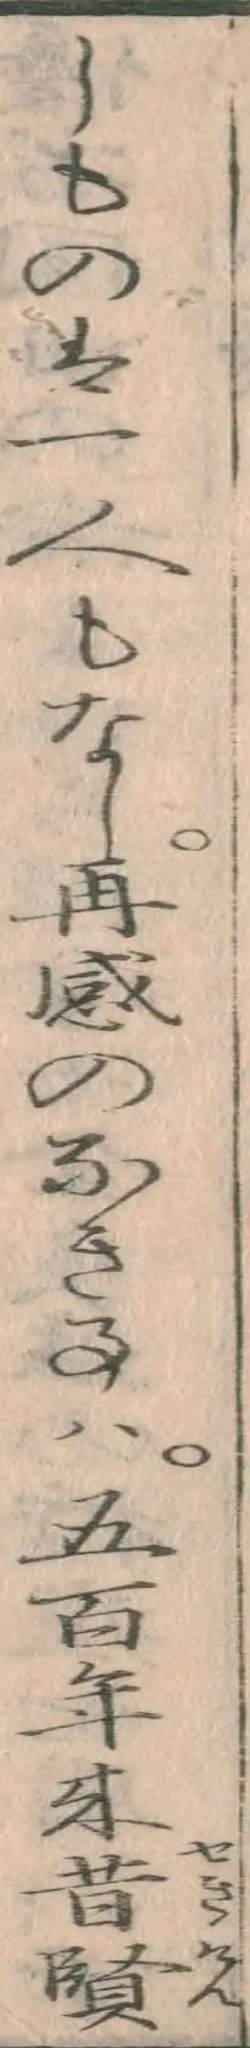しものは一人もなし。再感のなき事は。五百年来昔賢
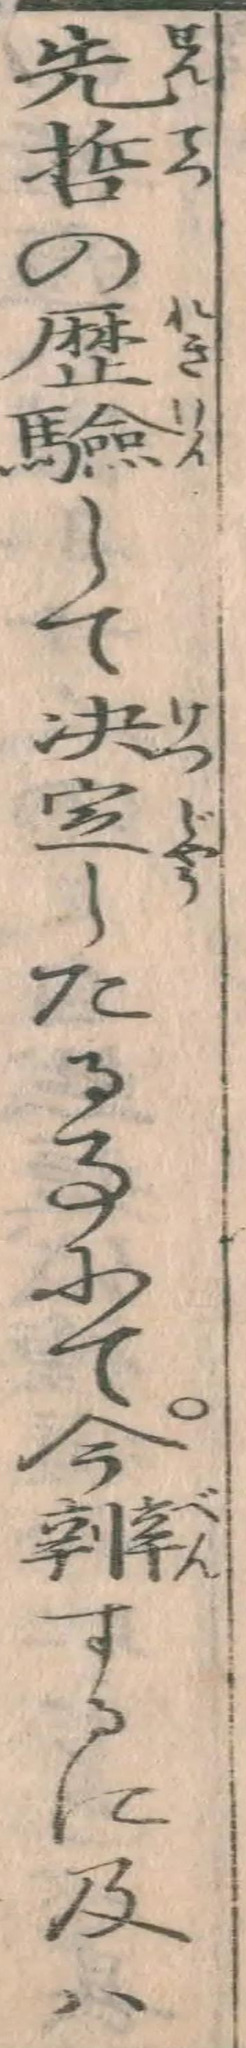先哲の歴験して決定したる事にて。今弁するに及は
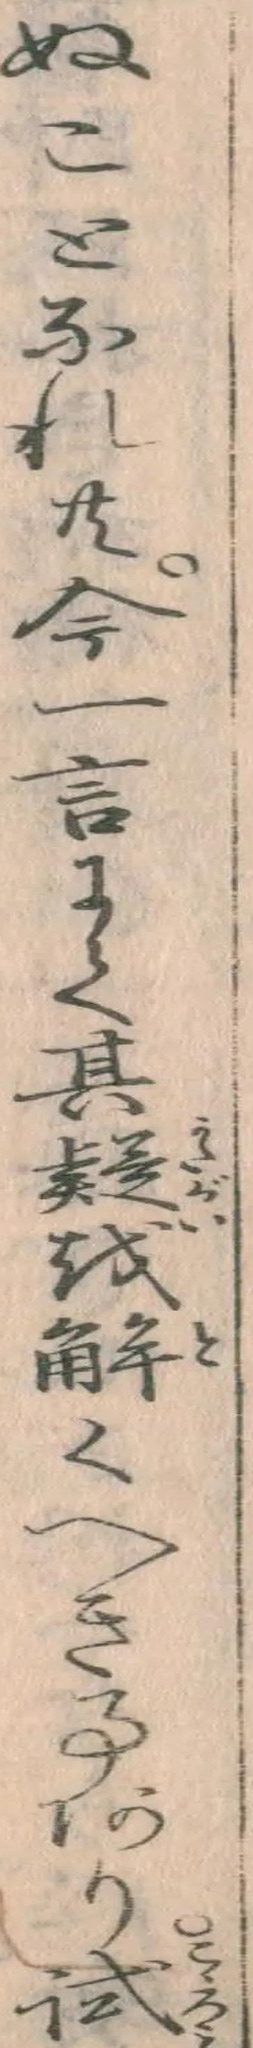ぬことなれ共。今一言にて其疑を解くへき事あり。試
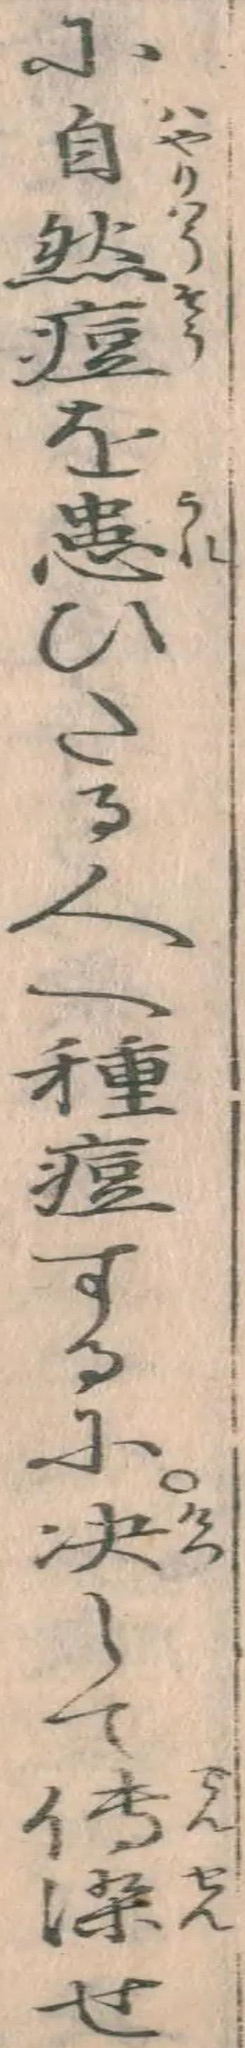に自然痘を患ひたる人へ種痘するに。決して伝染せ
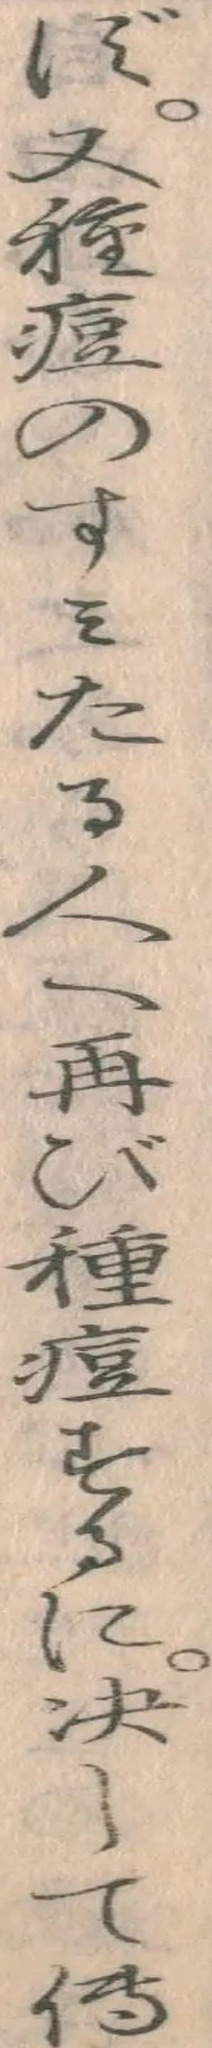ず。又種痘のすみたる人へ再び種痘するに。決して伝
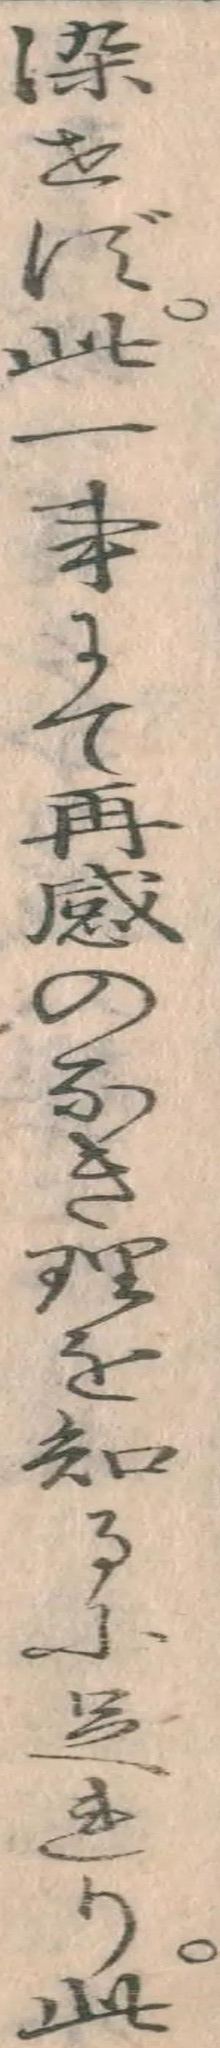染せず。此一事にて再感のなき理を知るに足れり。此
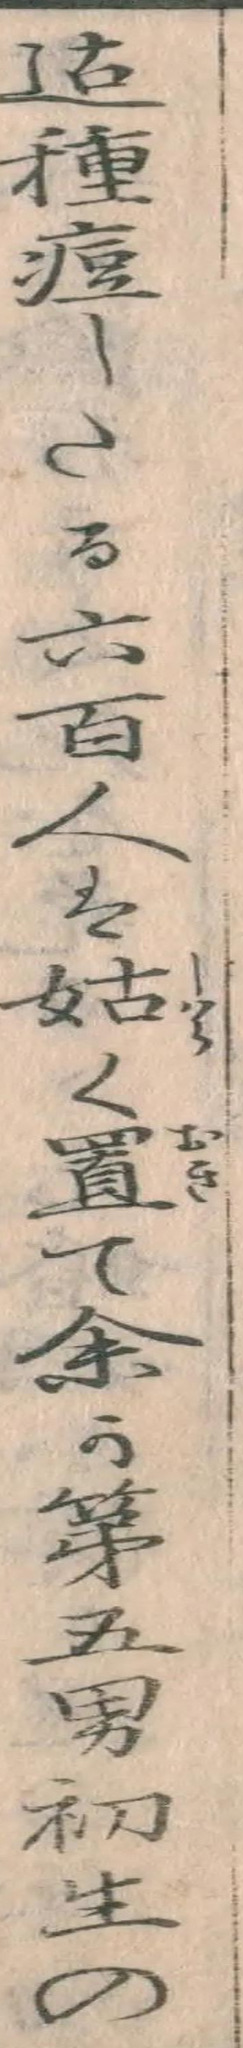迄種痘したる六百人は姑く置て余か第五男初生の
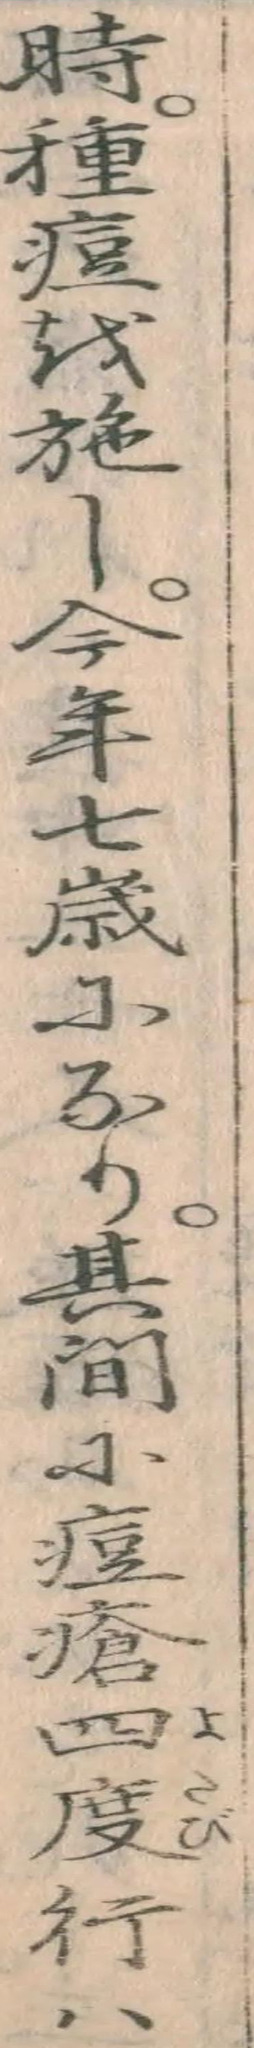時。種痘を施し。今年七歳になり。其間に痘瘡四度行は
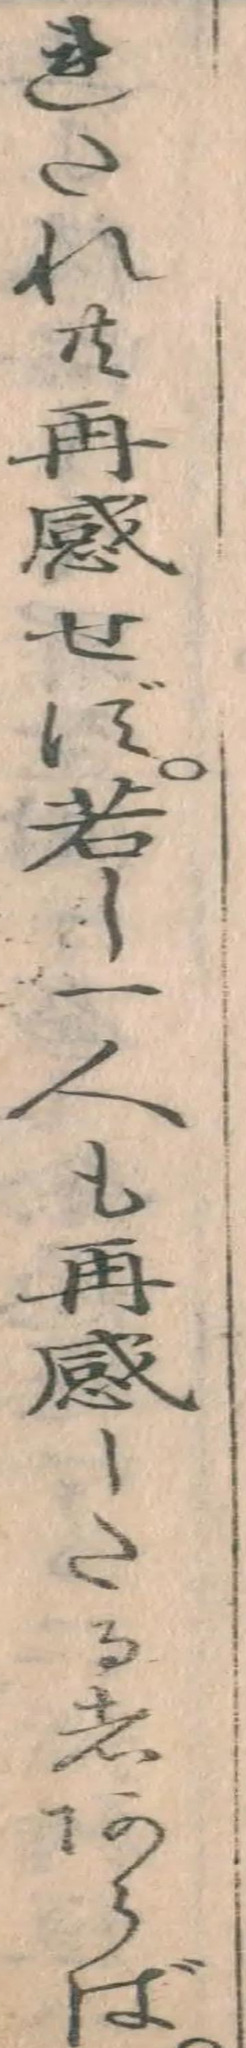れたれ共再感せず。若し一人も再感したる者あらば。

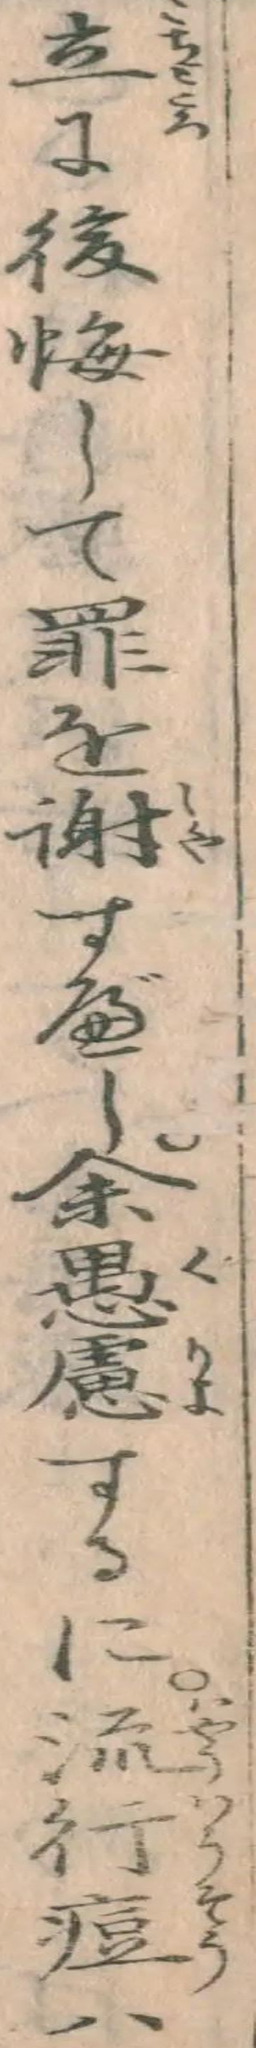立に後悔して罪を謝すべし。余愚慮するに。流行痘は
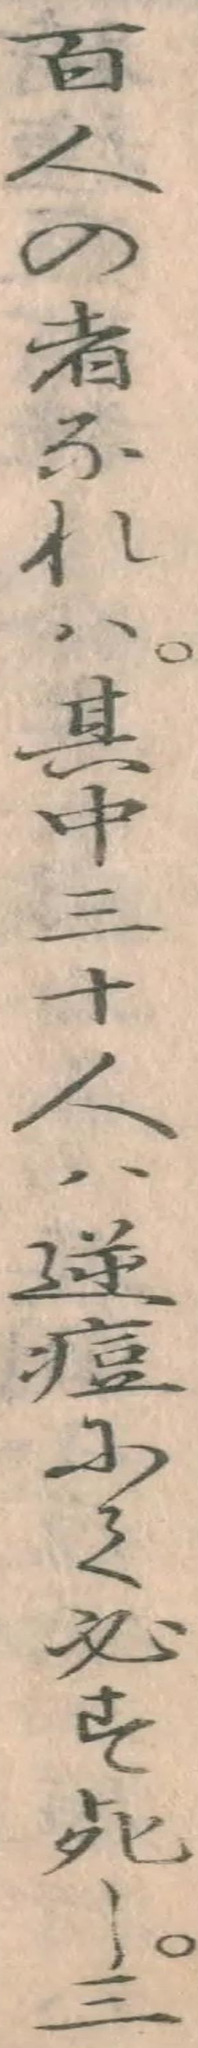百人の者なれは。其中三十人は逆痘にて必す死し。三
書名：種痘活人十全辯
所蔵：国立国会図書館 National Diet Library, JAPAN
